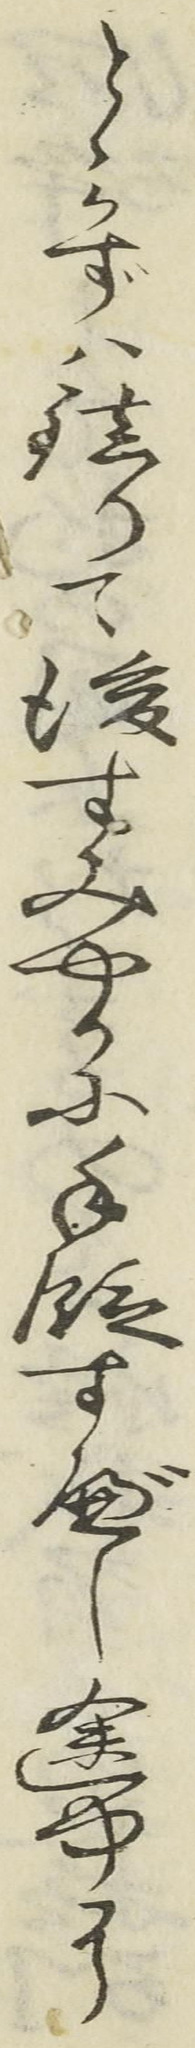としらすは鎮りて後すみやかに手段すべし途中に
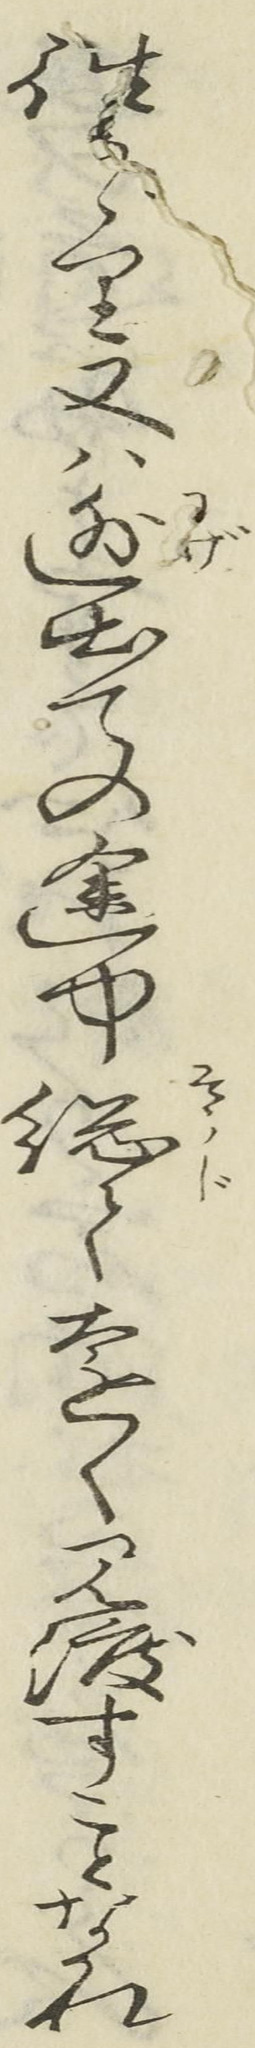往古よ里又は逃出ての途中総て遠く見渡すことなかれ
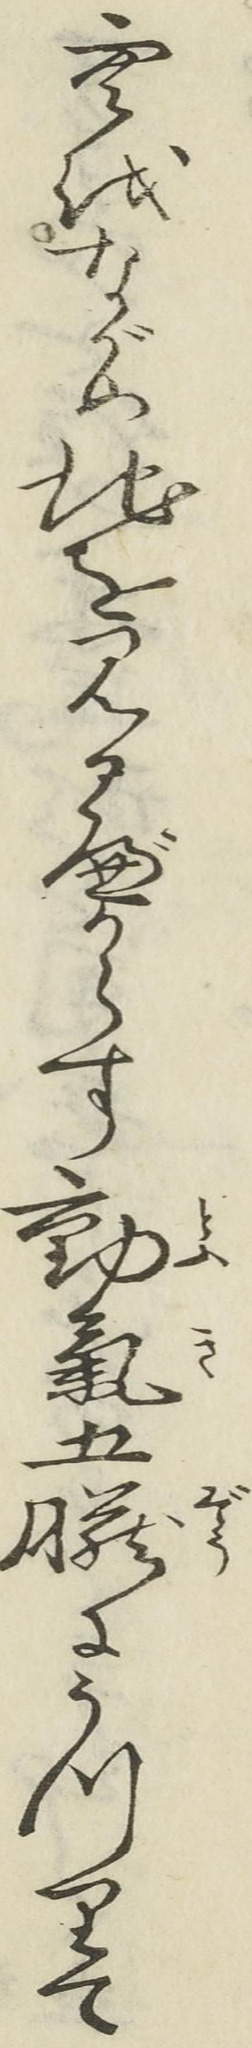空をながめ地を見るべからす動気五臓にうつりて
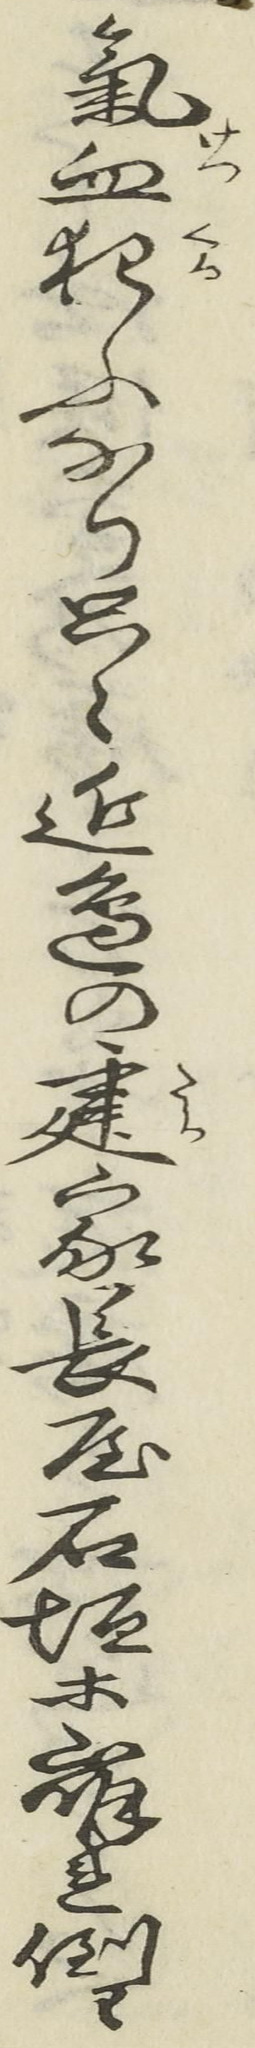気血狂ふなり只々近辺の建家長屋石垣杯崩れ倒るゝ
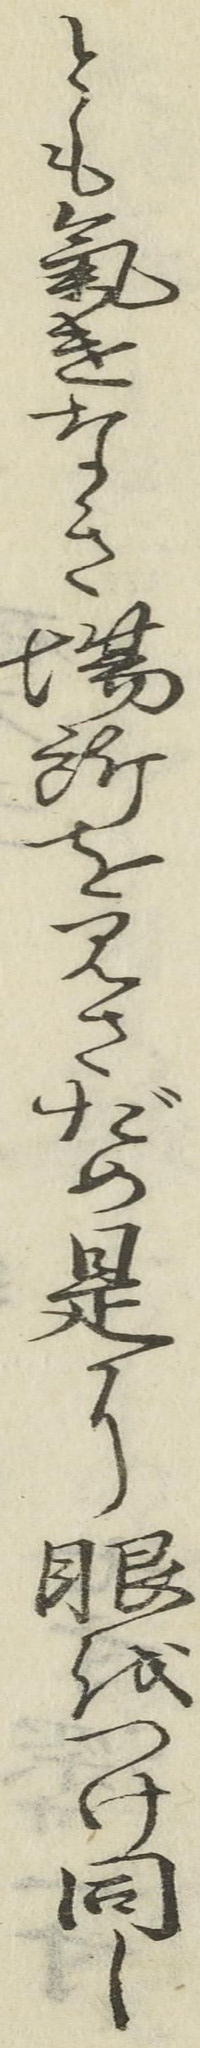とも気遣なき場所を見さだめてこれに眼をつけ同し
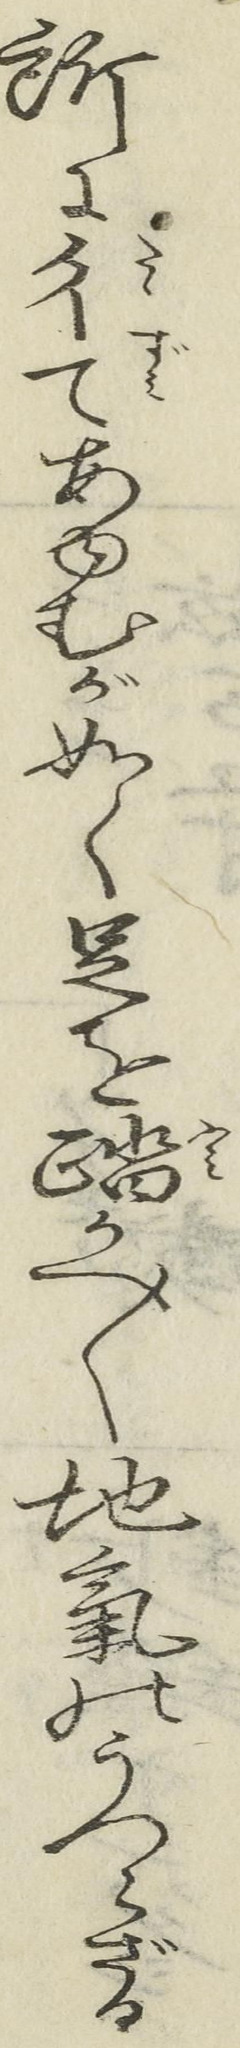所に彳てあゆむが如く是を踏かえ〳〵地気のうつらざる
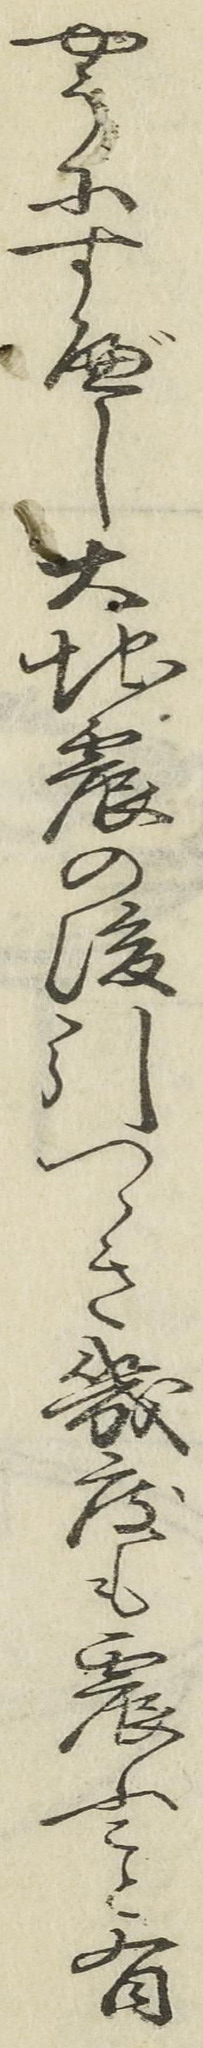やうにすべし大地震の後引つゝき幾度も震ふこと有
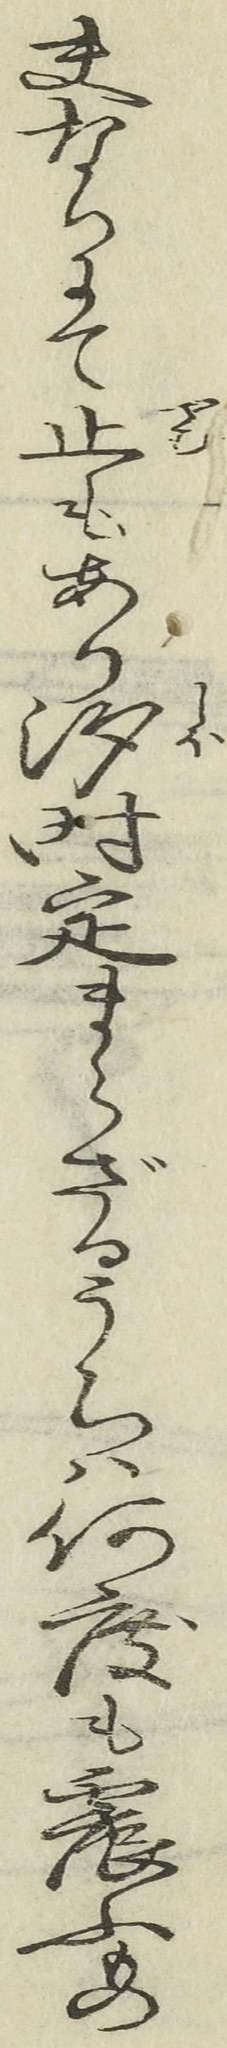夫なりにて止もあり汐時定まらざるうちは何度も震ふもの
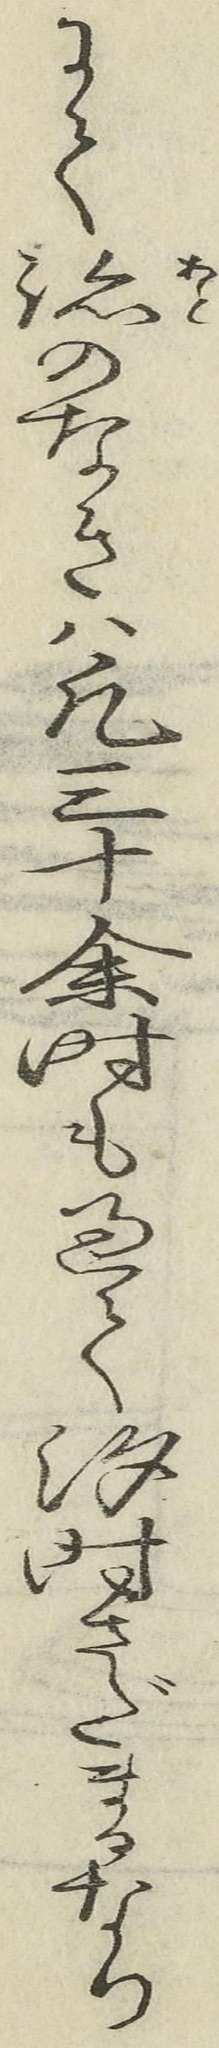にて跡のなきは凡三十余時も過て汐時さだまるなり
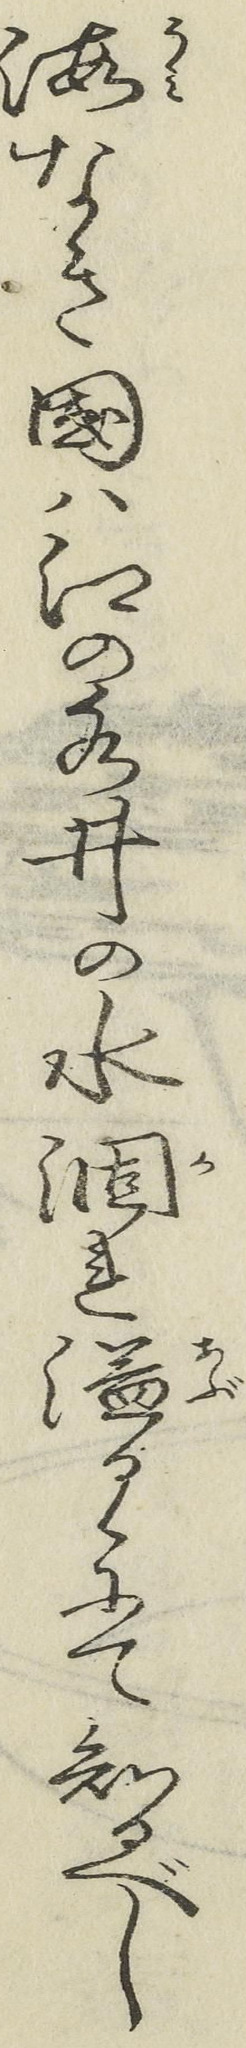海なき國は江の水井の水涸れ溢るゝにて知るべし
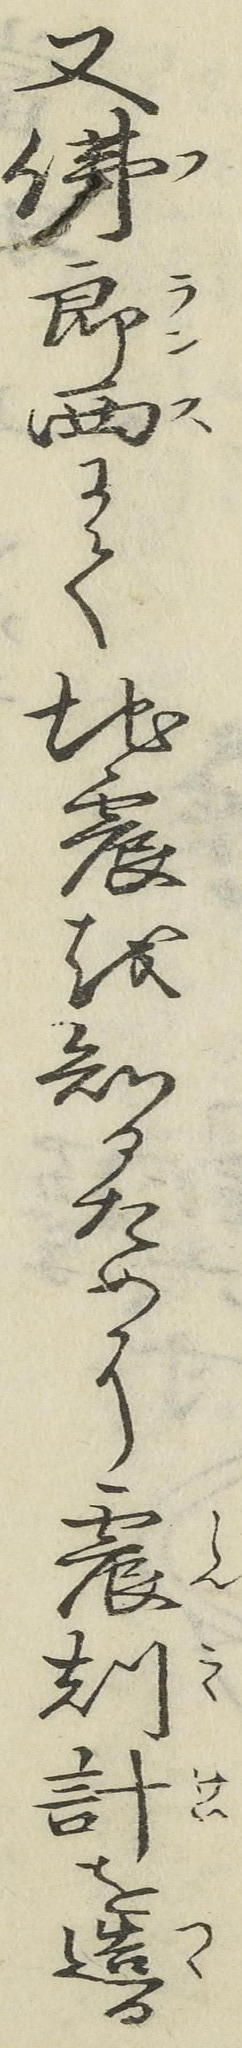又仏郎西にて地震をするために震刻計を造る
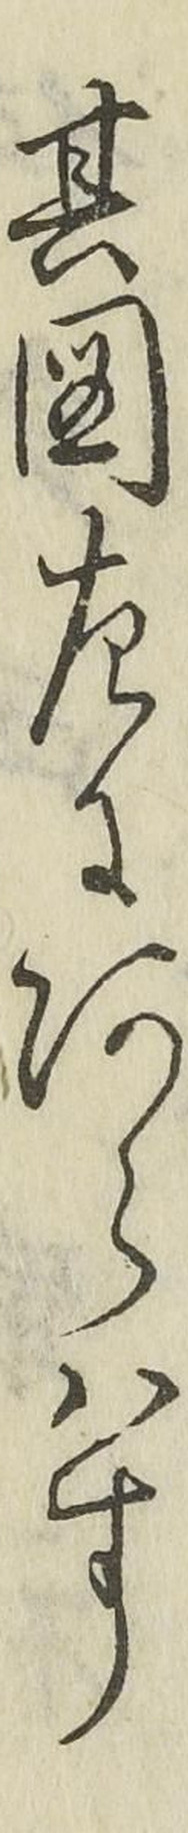其図左にあらはす

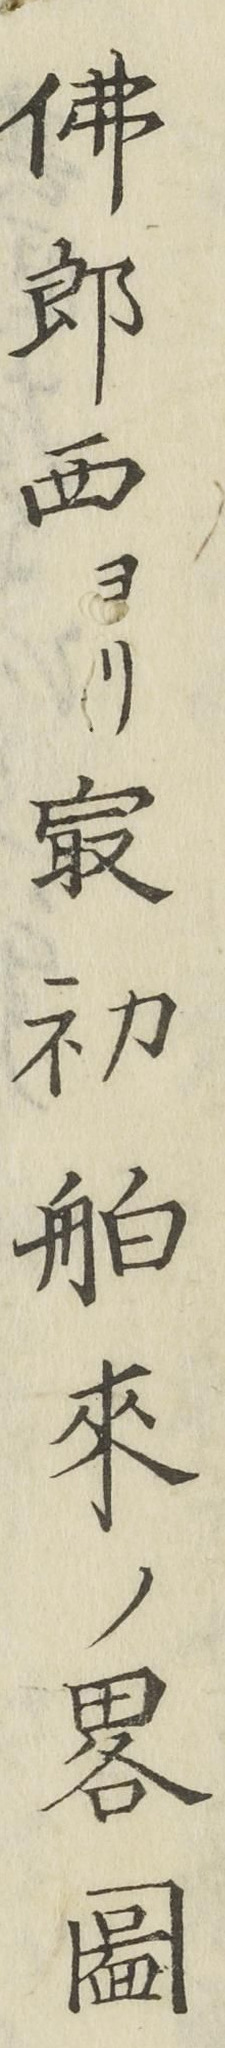仏郎西ヨリ最初舶来ノ略図
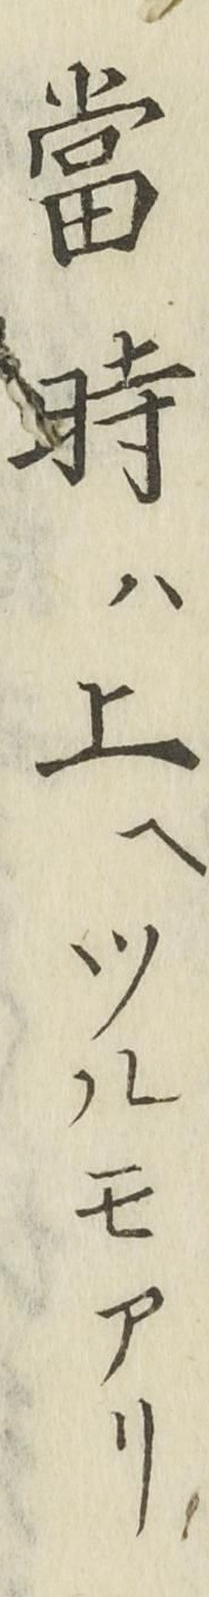当時ハ上へツルモアリ
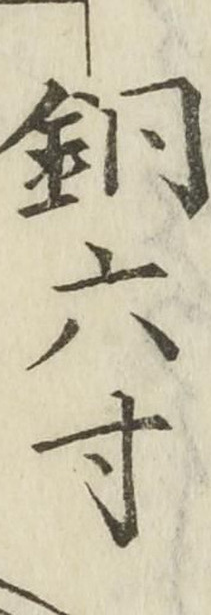銅六寸
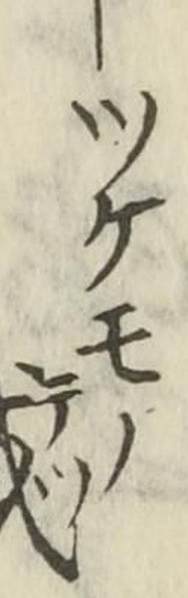ツケモノ鐡
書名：震雷考説　全
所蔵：東京大学地震研究所図書室 Earthquake Research Institute Library, The University of Tokyo, JAPAN
